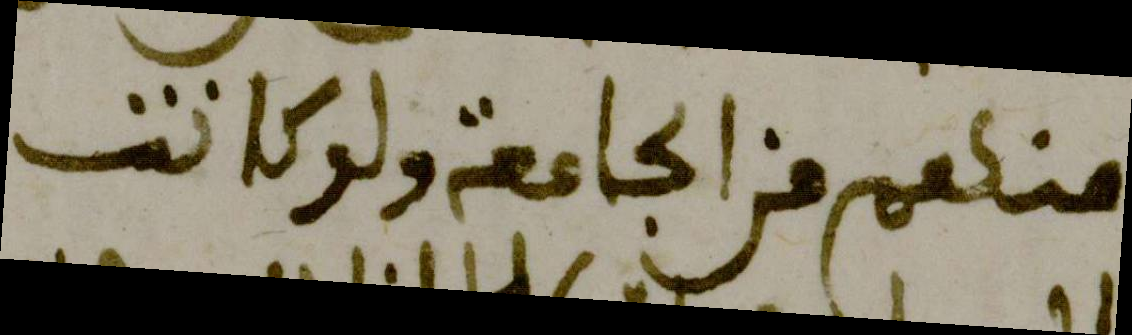منهم من الجامعة ولو كانت
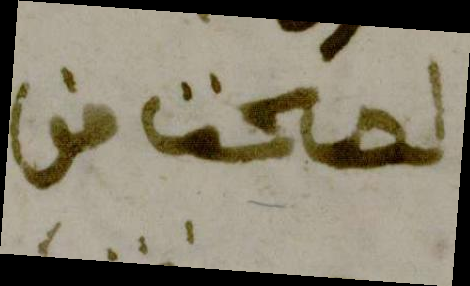لصحت من
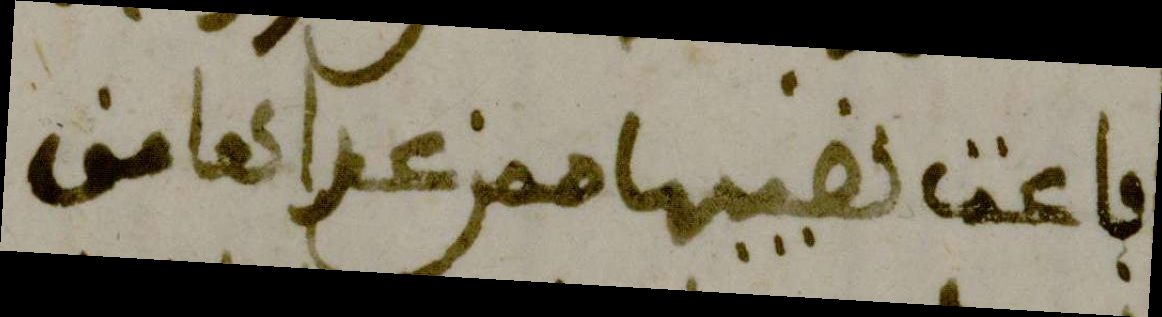باعت نصيبها ممن عداها من
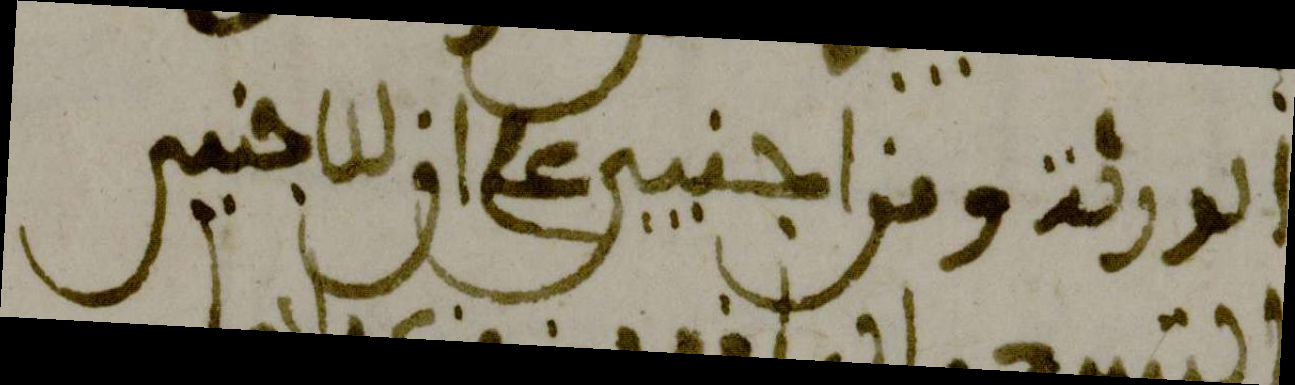الورثة ومن اجنبي على ان للاجنبي
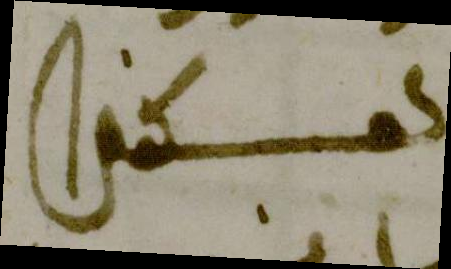هكذا
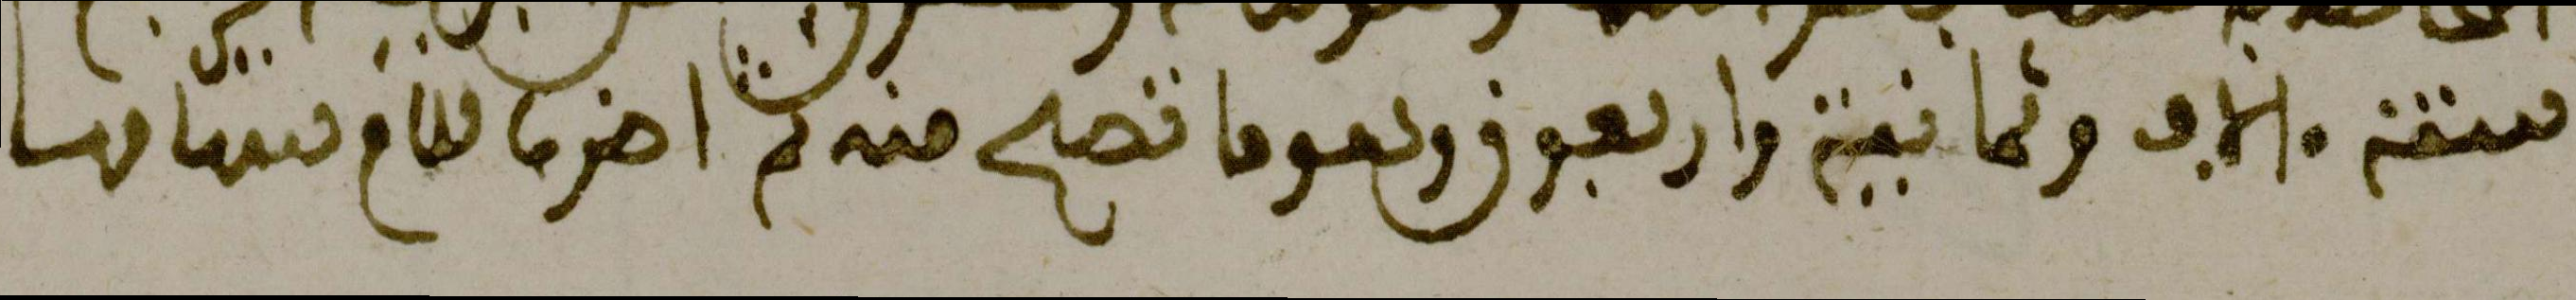ستة ءالاف وثمانية واربعون وهو ما تصح منه ثم اضرب للام سهامها
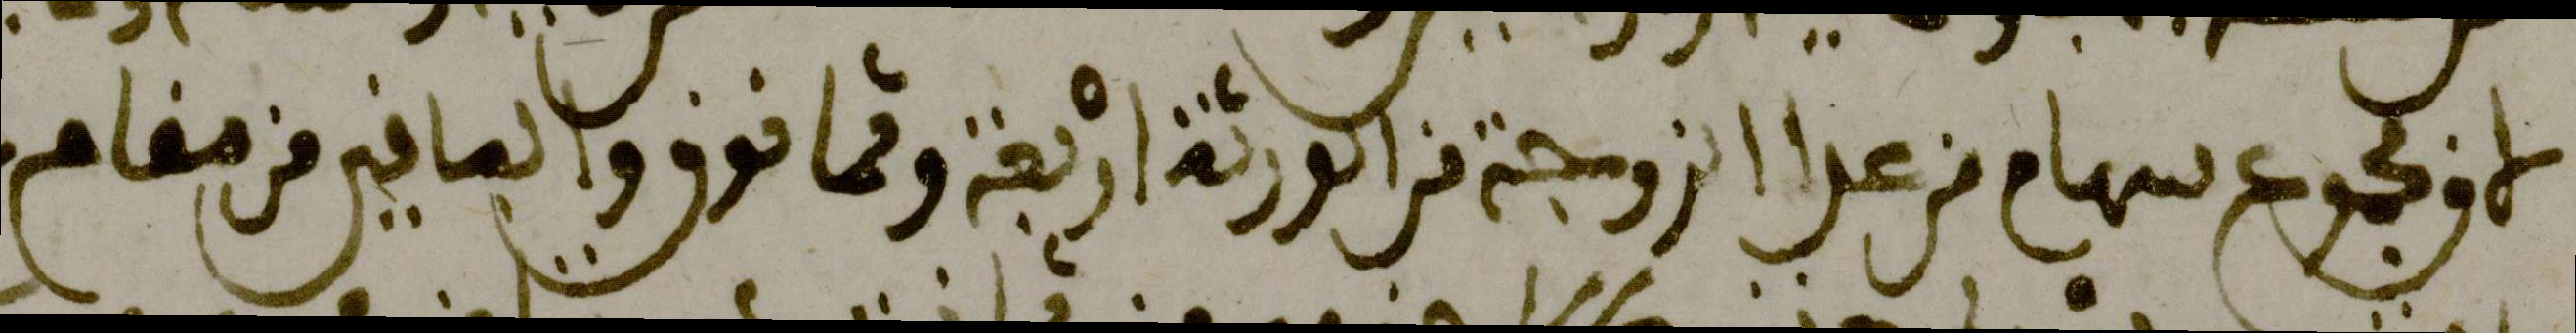لان مجموع سهام من عدا الزوجة من الورثة ارْبعة وثمانون والباقي من مقام
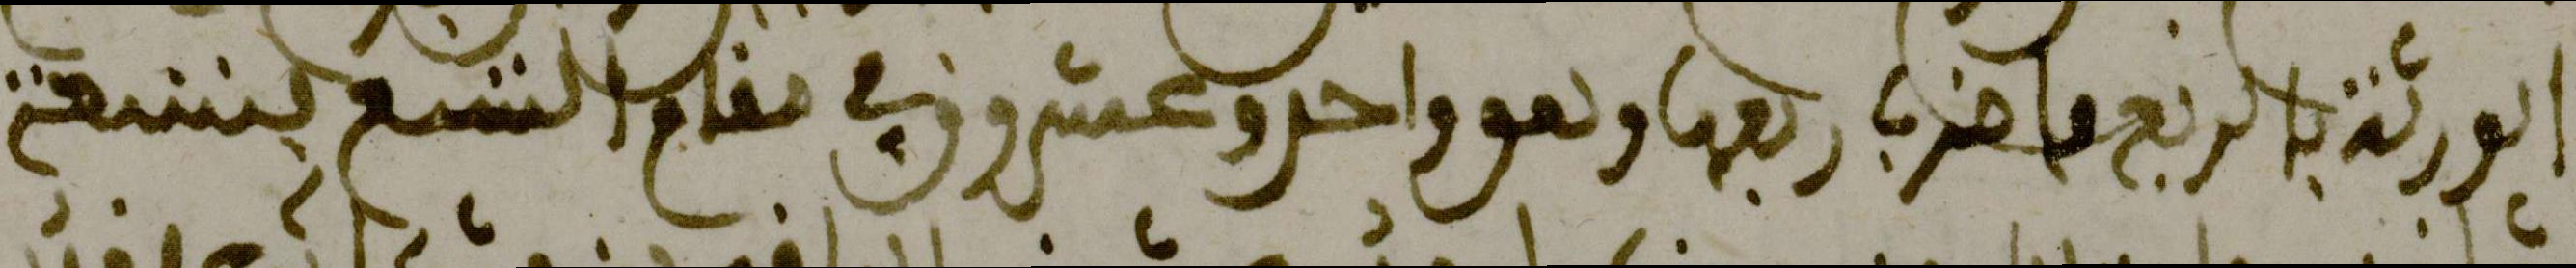الورثة بالربع فاضرب ربعها وهو واحد عشرون في مقام التسع بتسعة
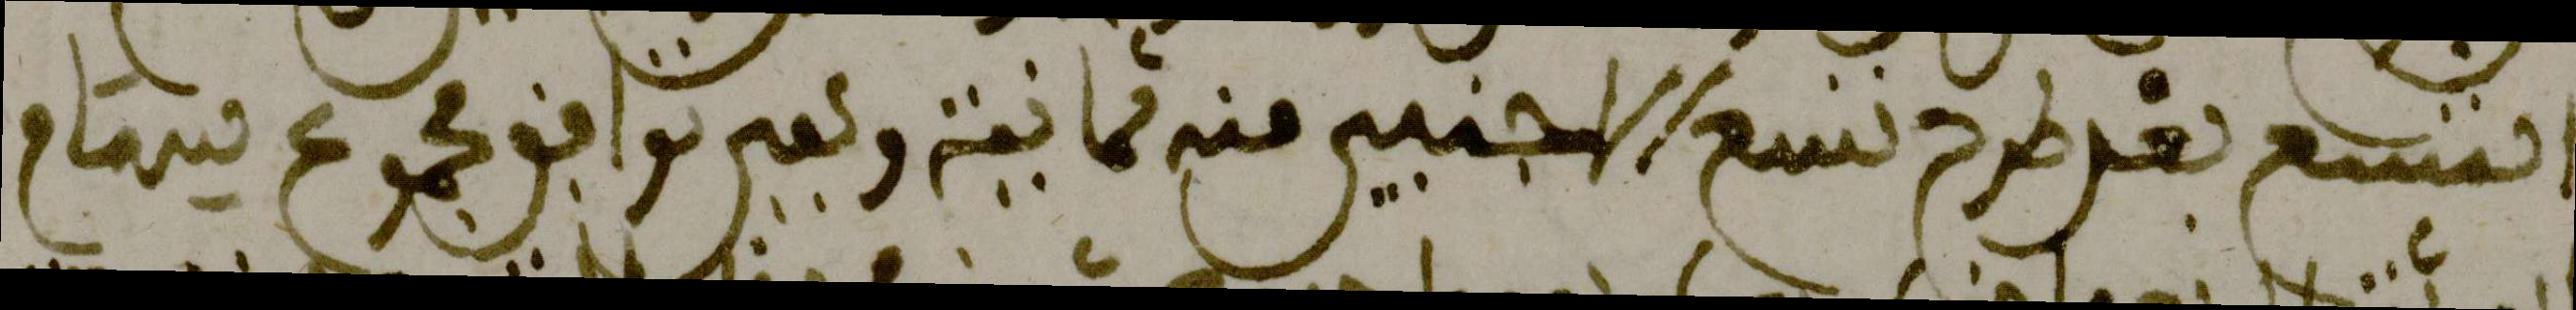التسع بعْد طرح تسع الاجنبي منه ثمانية وهي توافق مجموع سِهَام
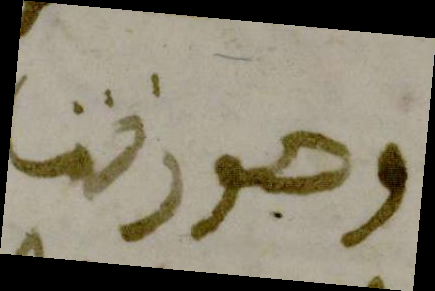وصرتها
